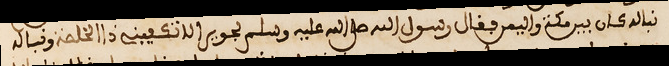نباله كان بين مكة واليمن فقال رسول الله صلى الله عليه وسلم لجوير الا تكفينى ذا الخلصة ونباله
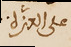على العذة
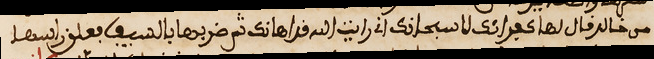من خالد قال لها كفرانك لا سبحانك انى رايت الله قد اهانك ثم ضربها بالسيف فعلق راسها
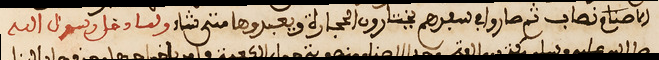الاصنام نصاب ثم صاروا في سفرهم يختارون الحجارة ويعبدوها متى شاء ولما دخل رسول الله
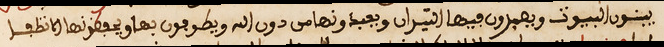يبنون البيوت ويصمرون فيها النيران ويعبدونها من دون الله ويطوفون بها ويحفضونها الا تطفا
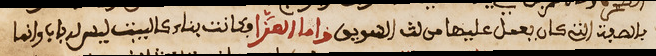بالصفة التي كان يعمل عليها من لث السويق واما العزّا فكانت بناء كالبيت ليس له باب وانما
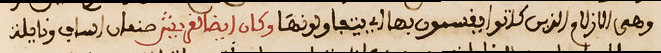وهى الازلام الذين كاتوا يقسمون بها اي يتفاولونها وكان ايضا لقريش صنمان اساف ونايلة
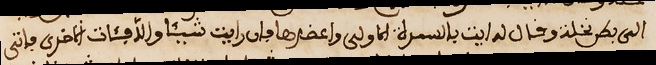الى بطن نخلة وقال له ايت بالسمرة الأولى واعضدها فان رايت شيئا والاّ فئات الاخرى فاتى
